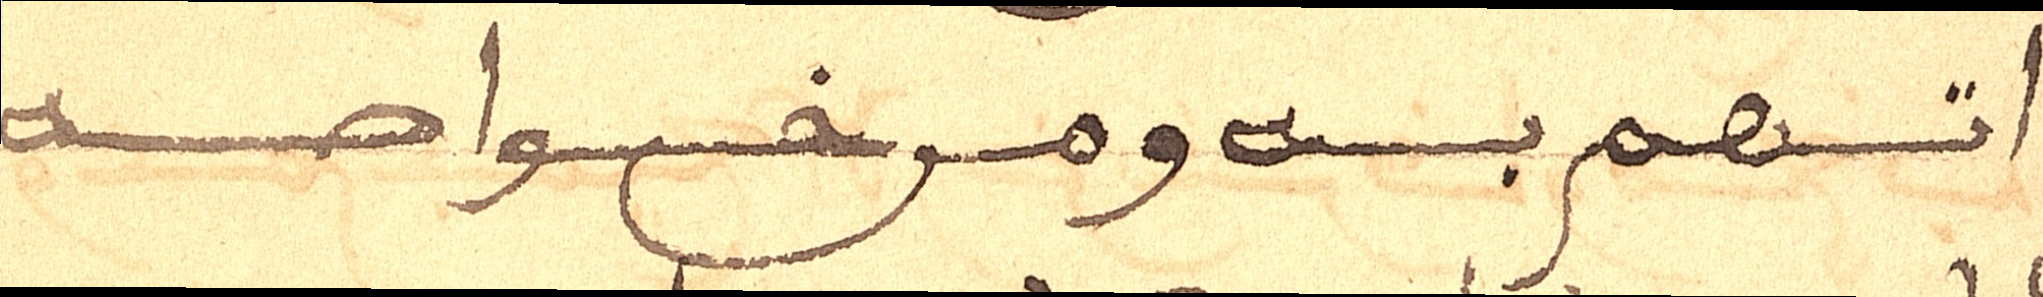اتهم به ومن خواصه
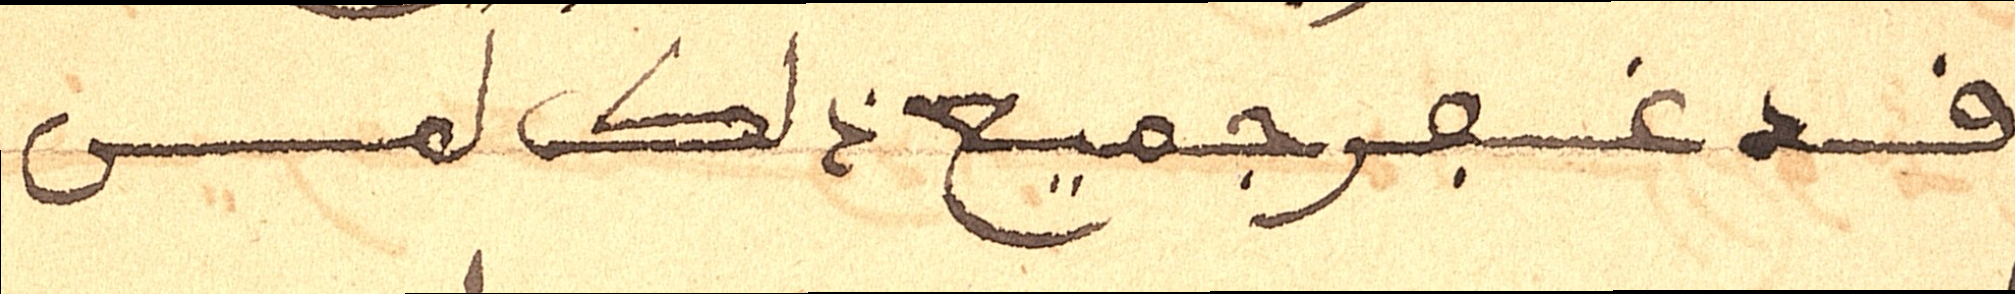قد غفر جميع ذلك لمن
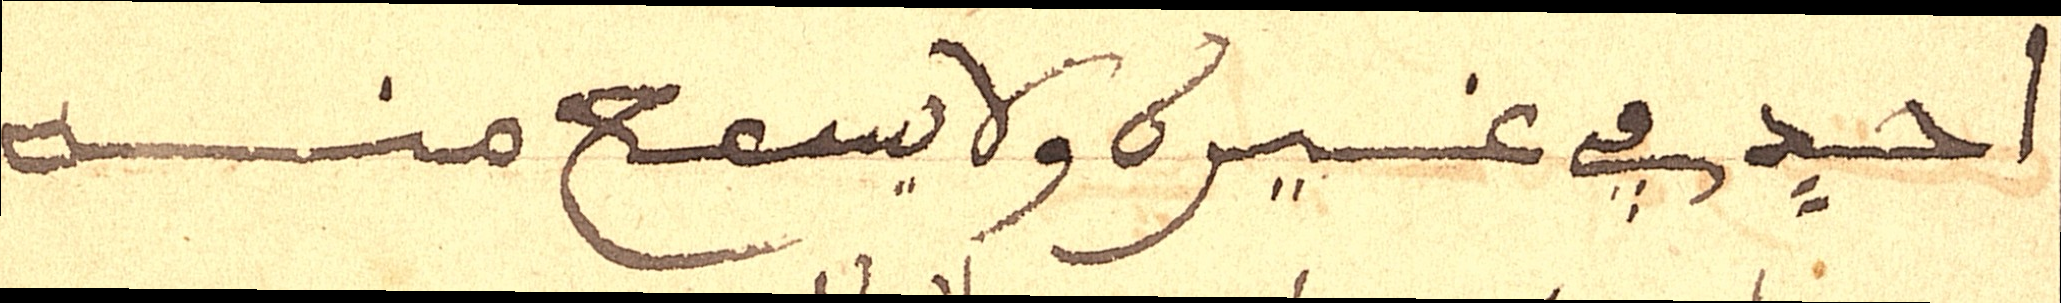احد في غيره ولا يسمع منه
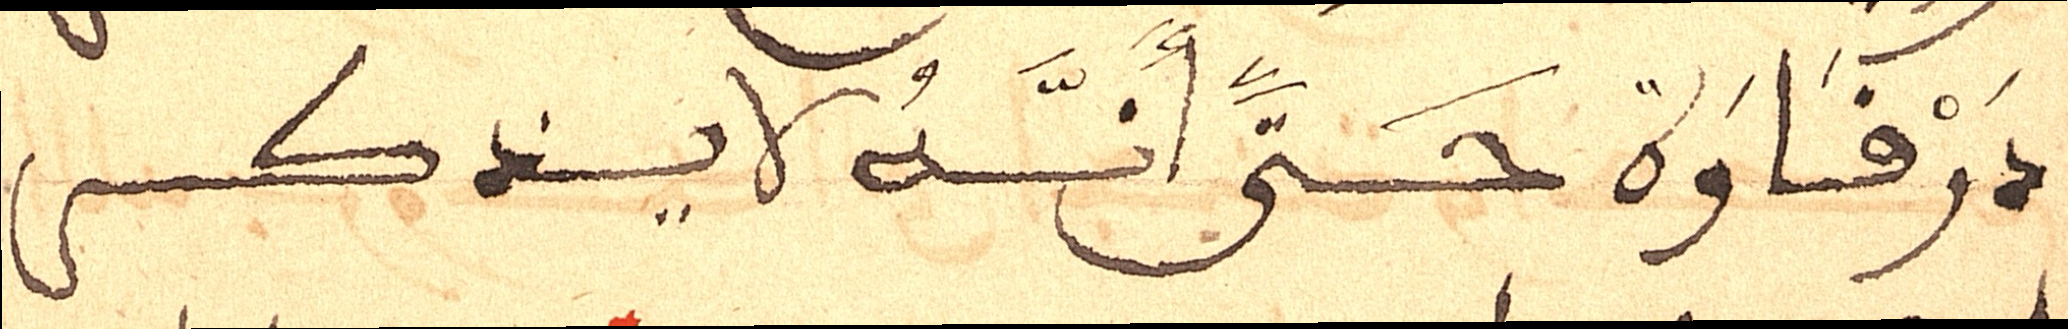درقاوه حتى انه لا يذكر
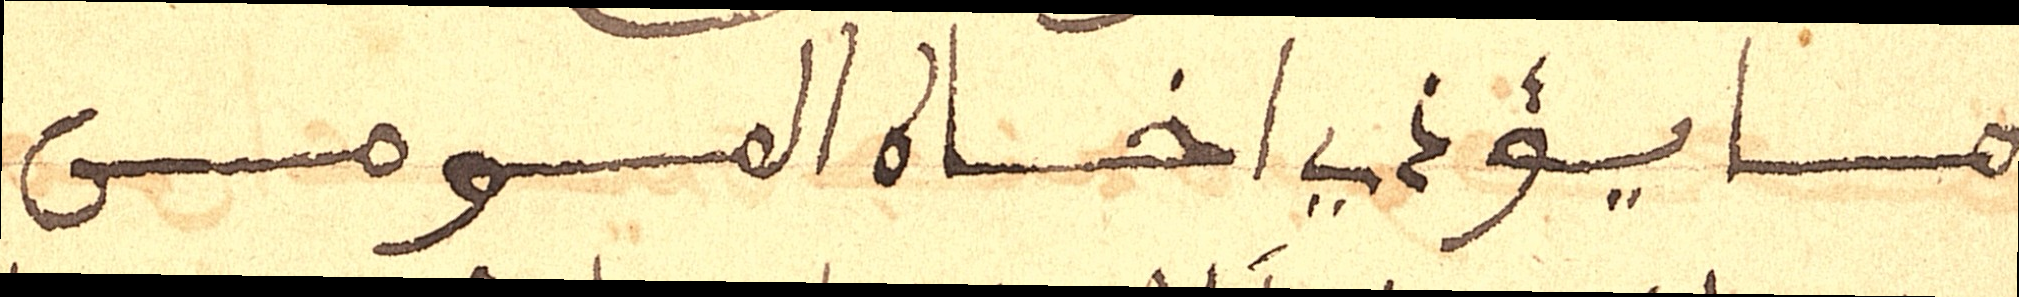ما يؤذي اخاه المومن
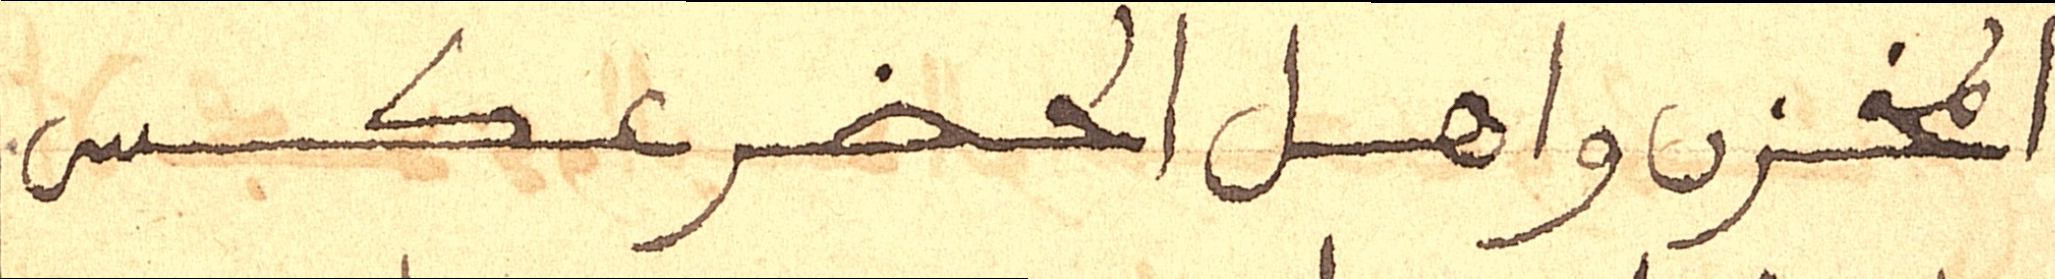المخزن واهل الحضر عكس
